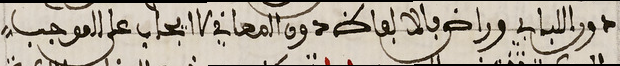دور اللبابي و راض بالالفاظ دون المعاني لا ايجاب على الموجب
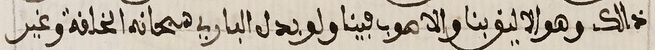ذالك و هو لا يليق بنا و الا صوب فينا و لو بدل الباري سبحانه الخلقه و غير
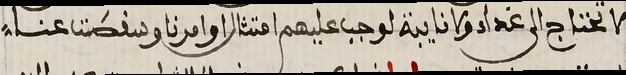لا تحتاج الى غداء و لا نايبة لوجب عليهم امتثال اوامرنا و سقطت عنا
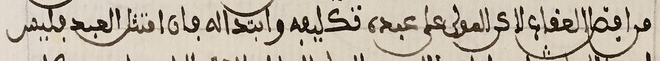من افضل العقاب لا كر للمولى على عبده تكليفه و ابتدا له فان امتثل العبد فليس
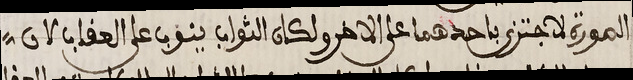الصورة لاجتزى باحدهما على الاخر و لكان الثواب ينوب على العقاب لان
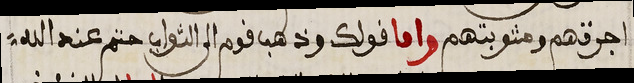اجرتهم و مثوبتهم و اما قولك و ذهب قوم الى الثواب حتم عند الله
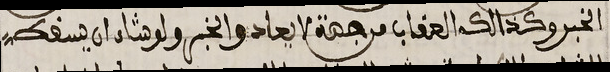الخبر و كذالك العقاب من جهة لا يعاد الخبر ولو شاء ان يسقط
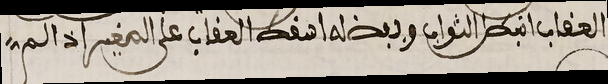العقاب انبطل الثواب و بفضله اسقط العقاب على المغير اذا لم
